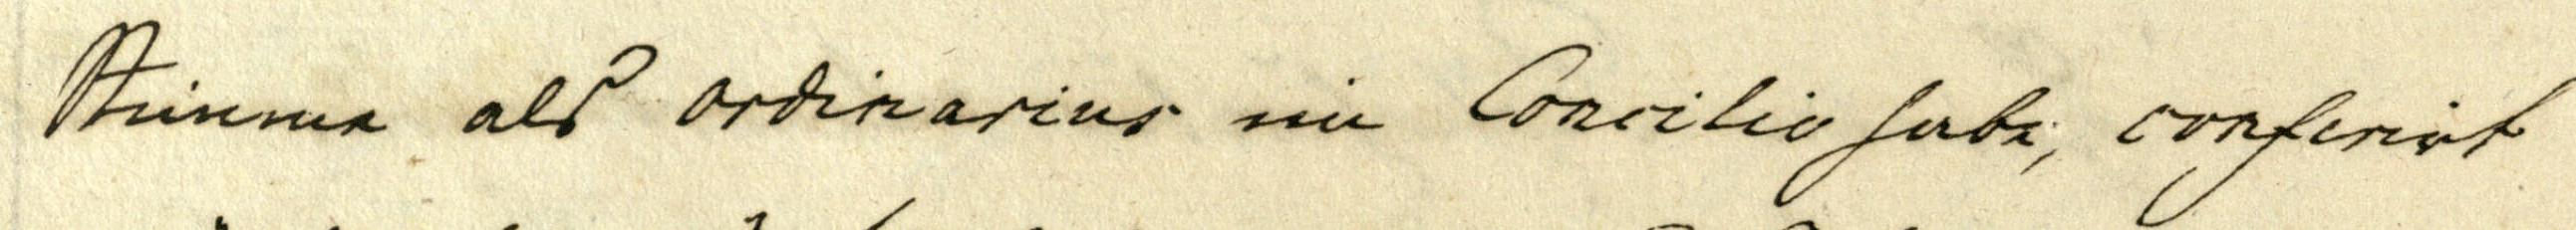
Stimme als ordinarius im Concilio habe, conferirt
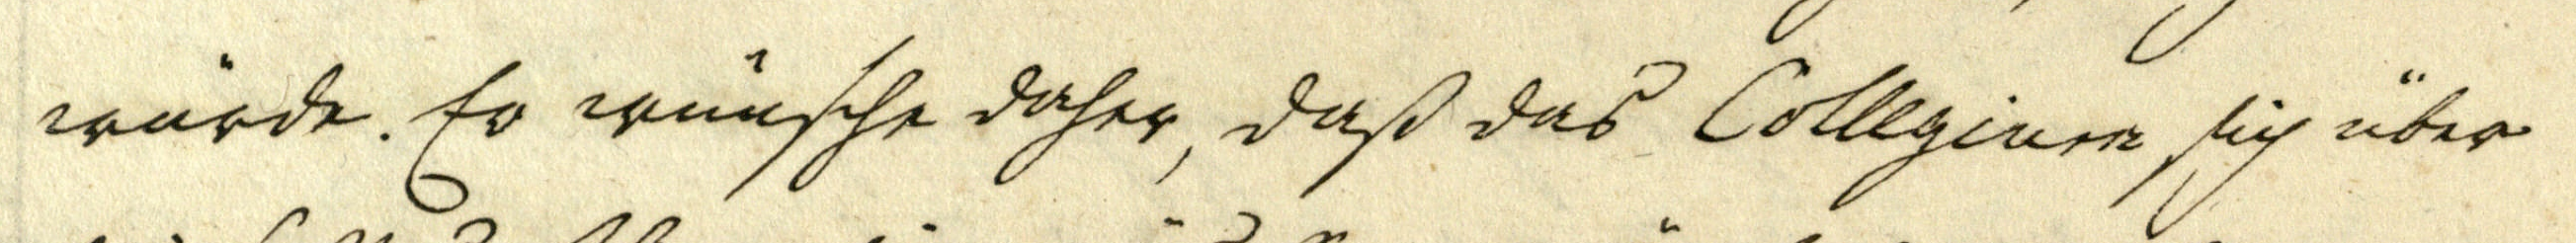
würde. Er wünsche daher, daß das Collegium sich über
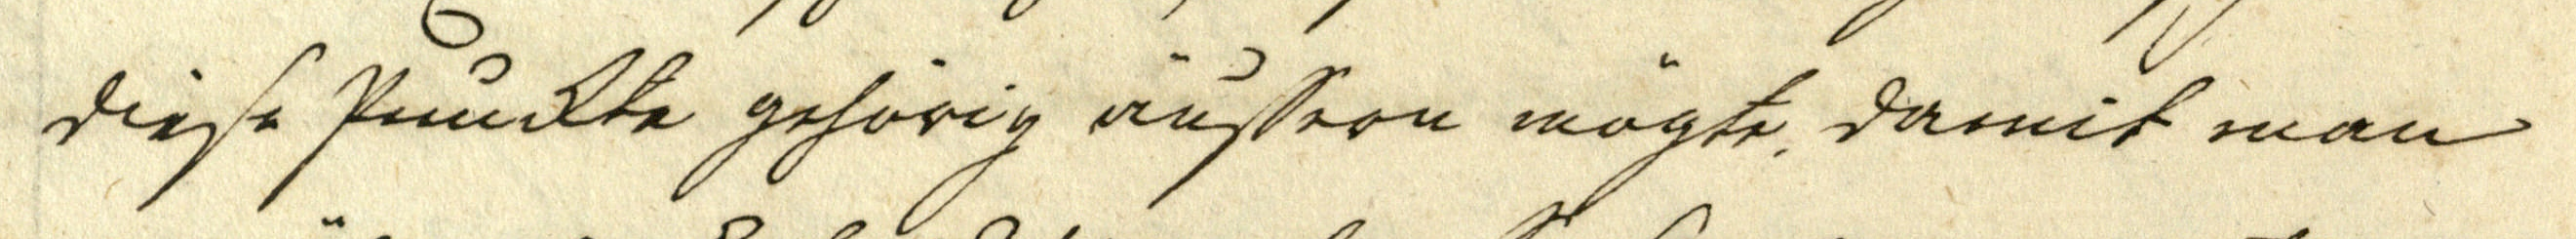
diese Punckte gehörig äussern mögte. Damit man
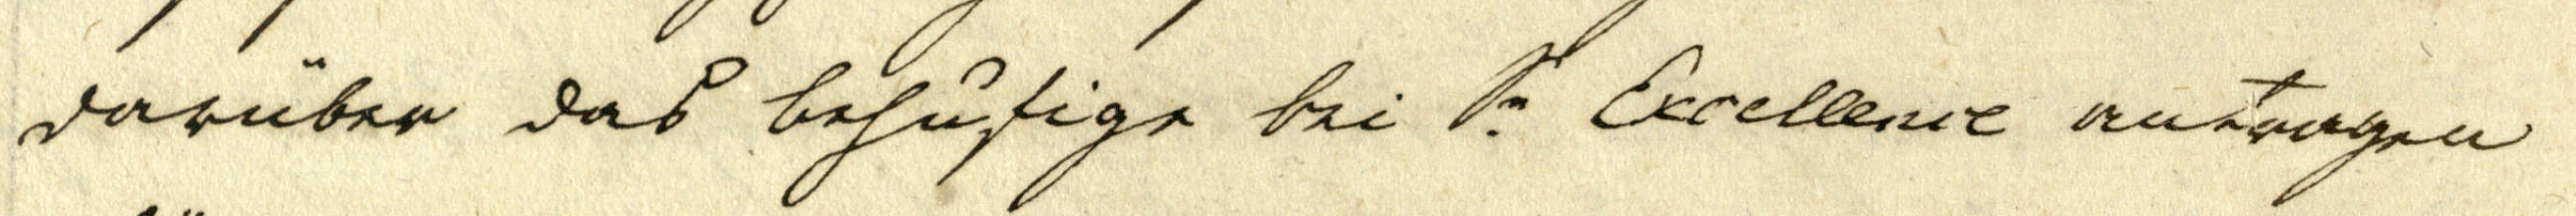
darüber das behufige bei Sr. Excellence antragen
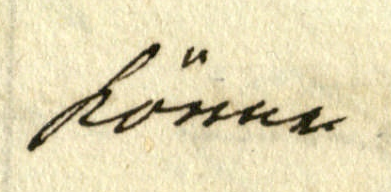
könne.
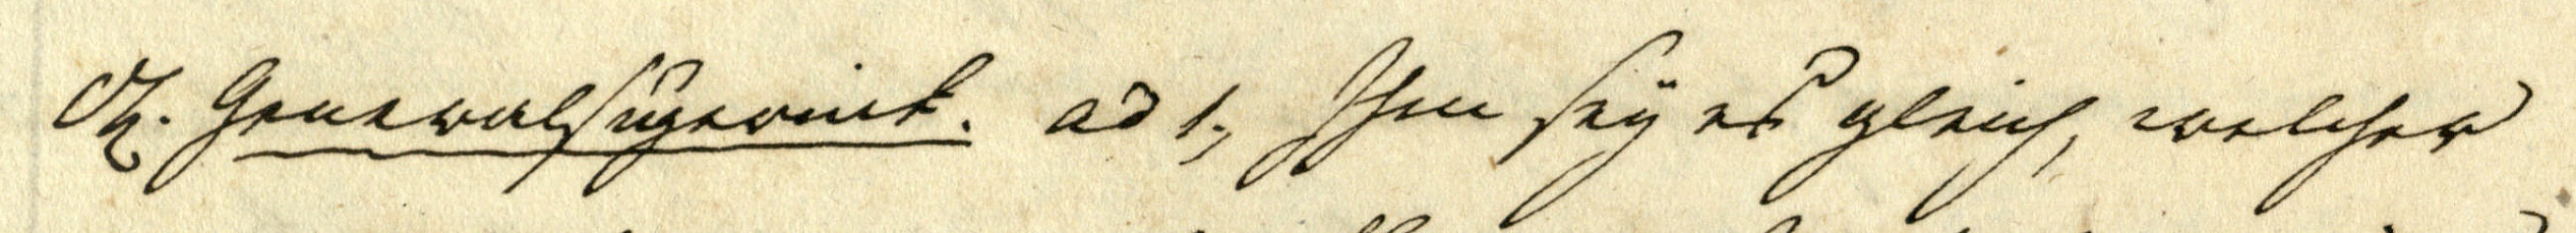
dh Generalsuperintendent. ad 1, Ihm seÿ es gleich, welcher
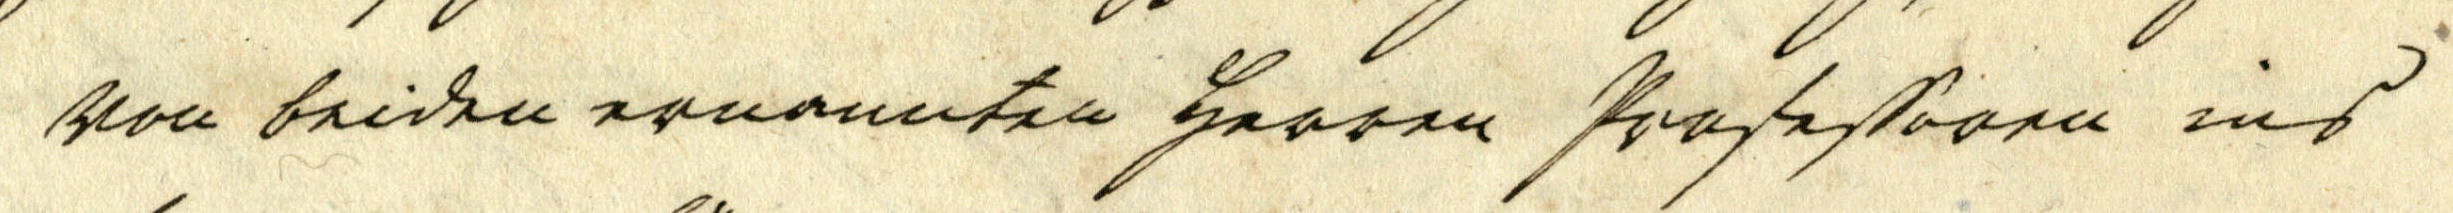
von beiden ernannten Herren Professoren ins
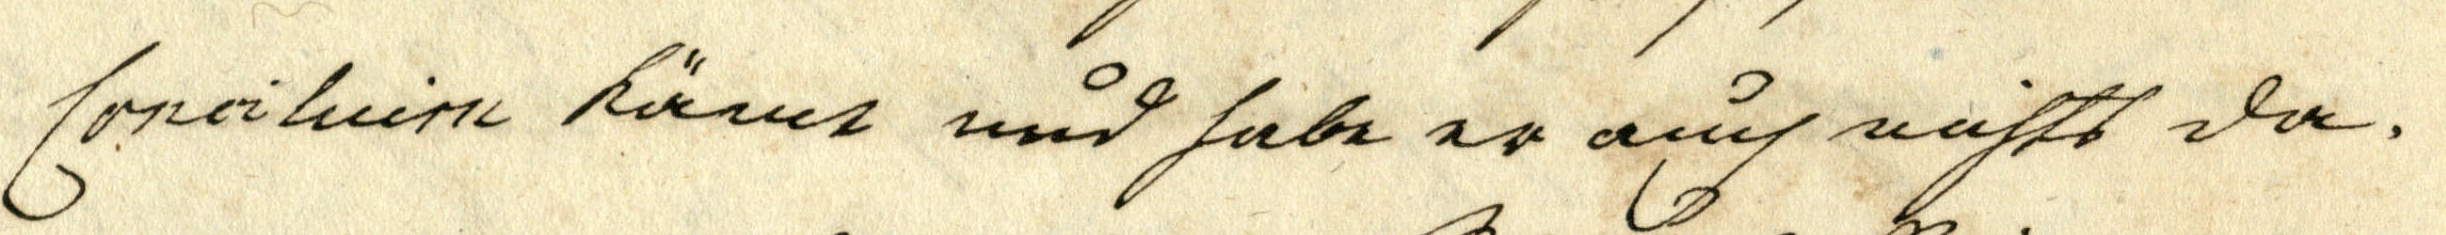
Concilium käme und habe er auch nichts da¬
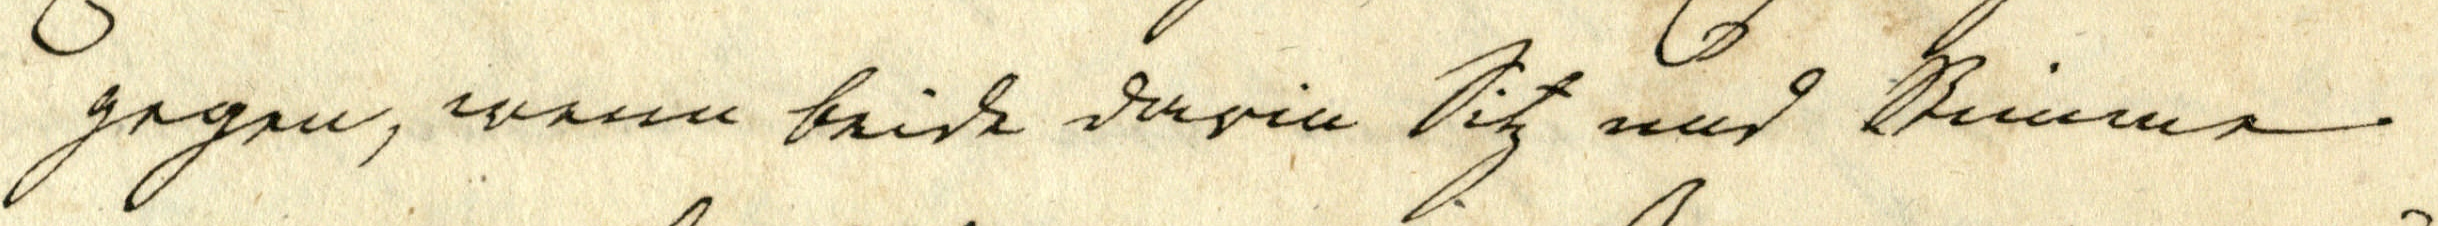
gegen, wenn beide darin Sitz und Stimme
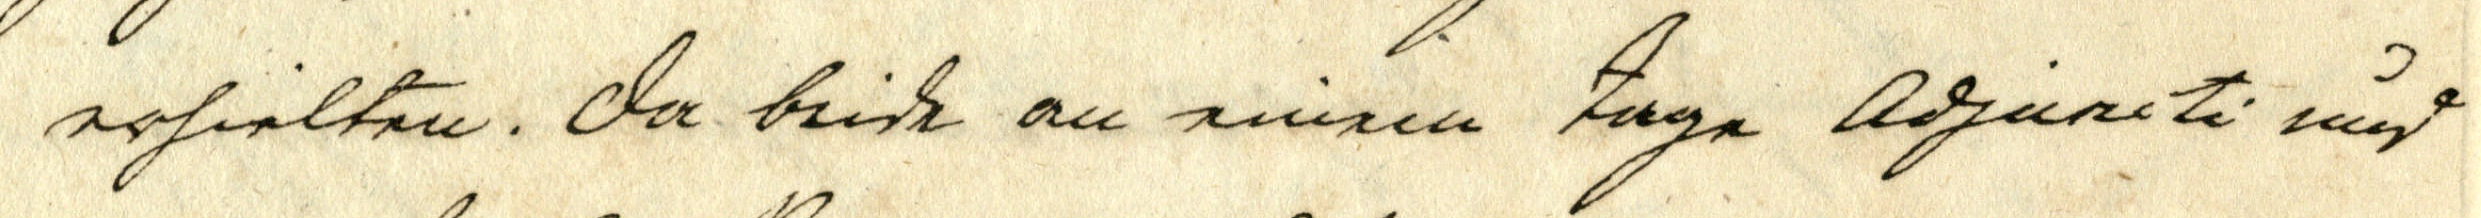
erhielten. Da beide an einem Tage Adjuncti und
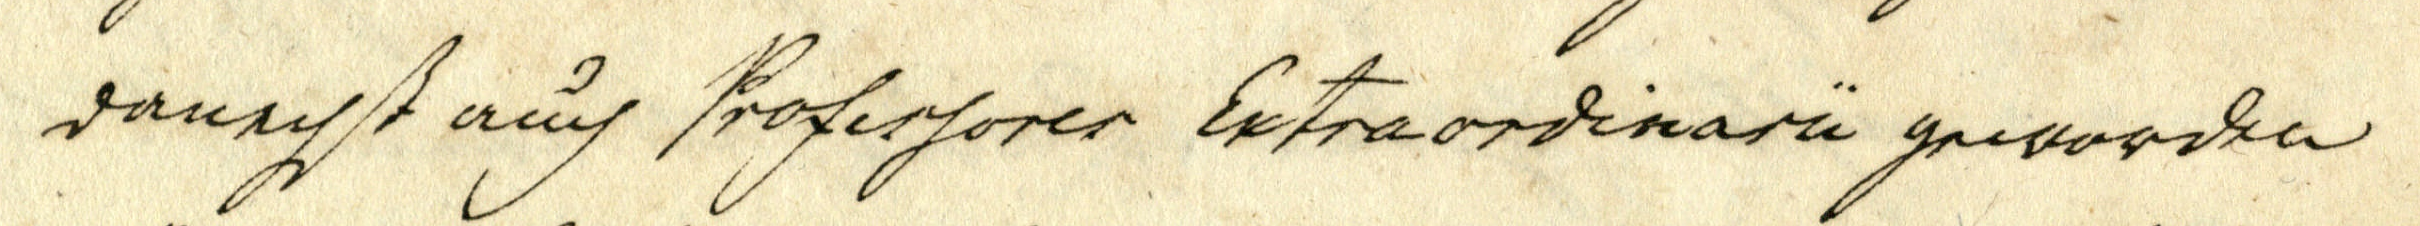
danechst auch Professores Extraordinarii geworden
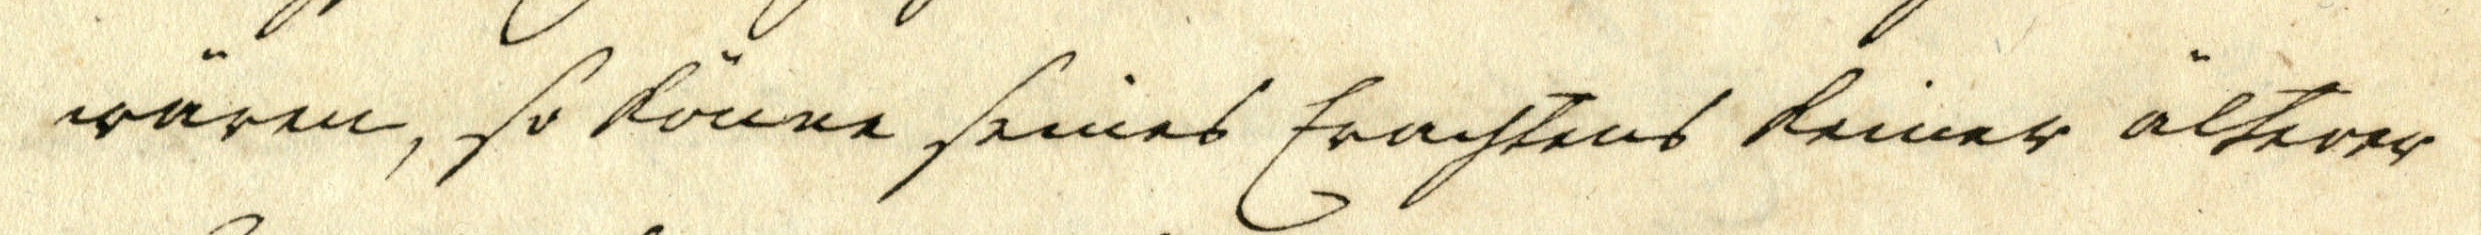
wären, so könne seines Erachtens keiner älterer
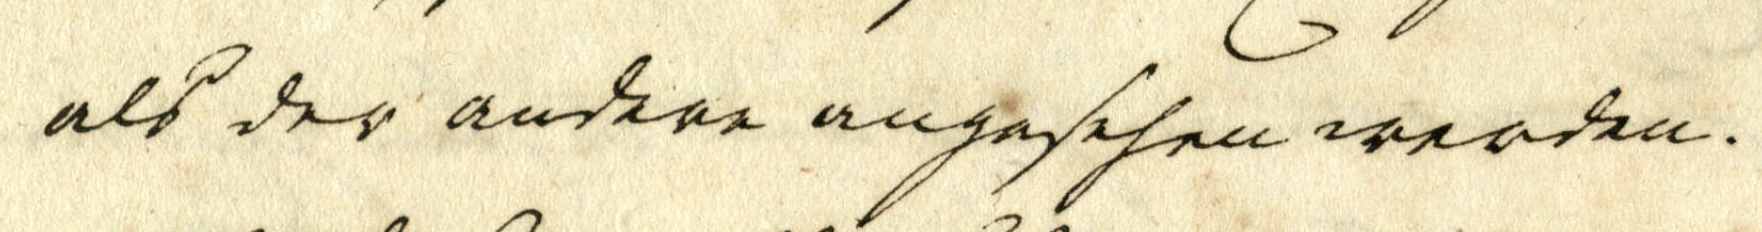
als der andere angesehen werden.
